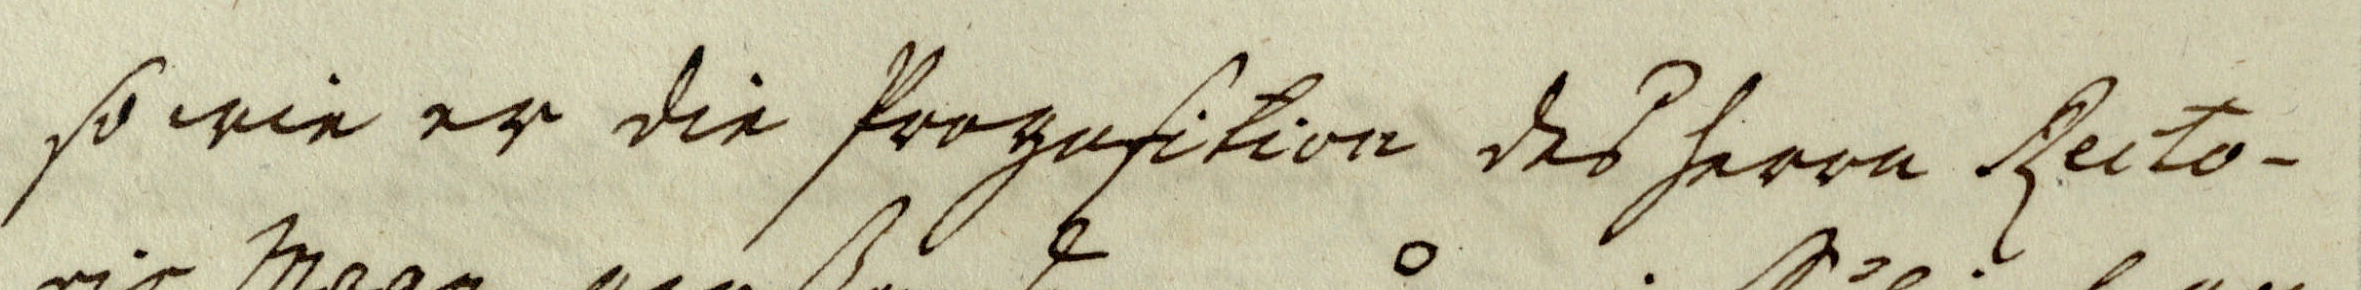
so wie er die Proposition des Herrn Recto¬
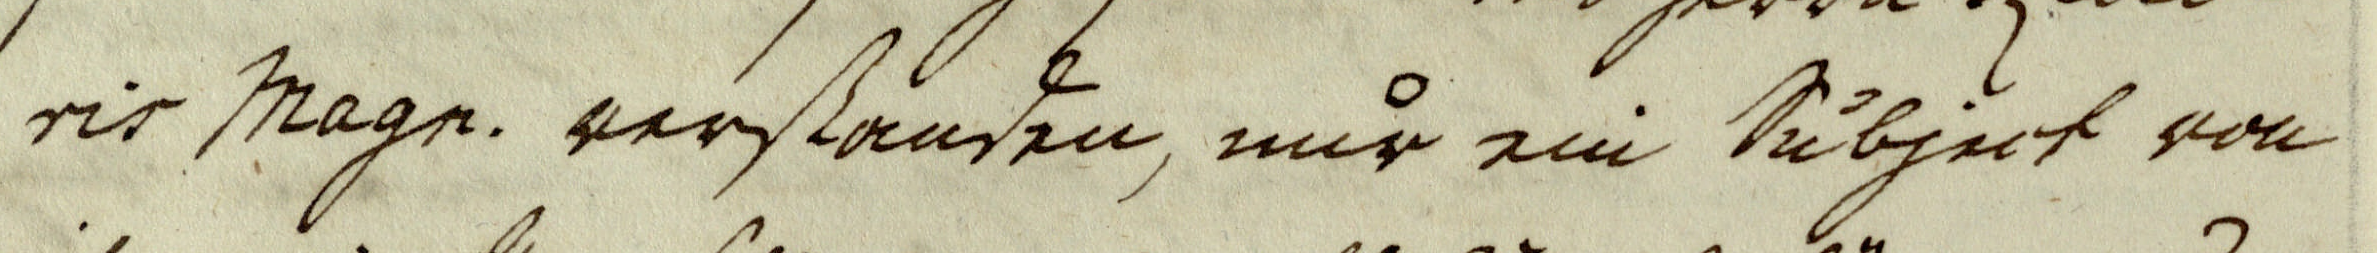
ris Magn. verstanden, nur ein Subject von
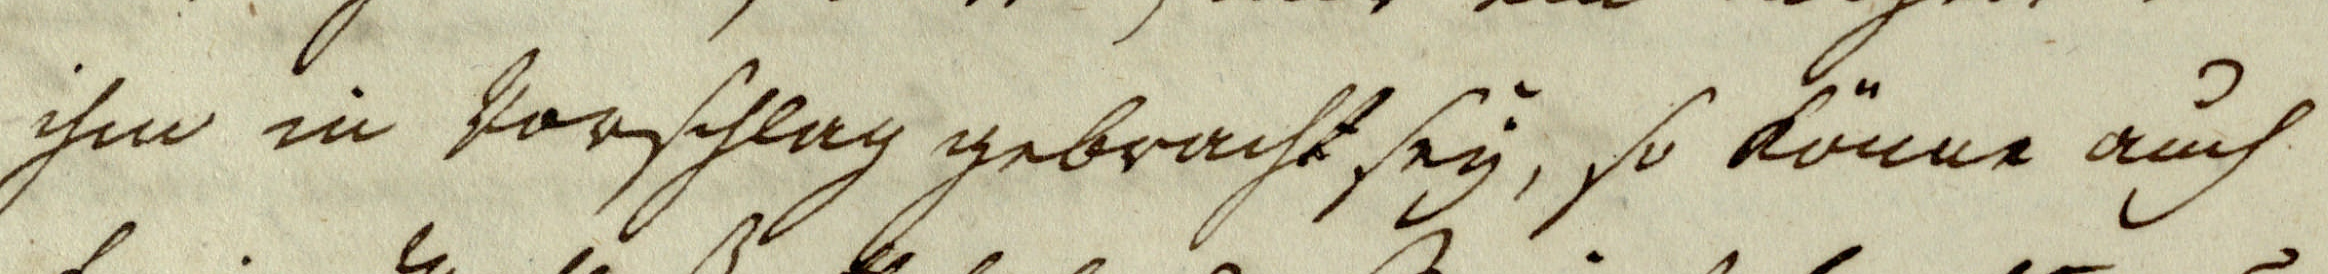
ihm in Vorschlag gebracht seÿ, so könne auch
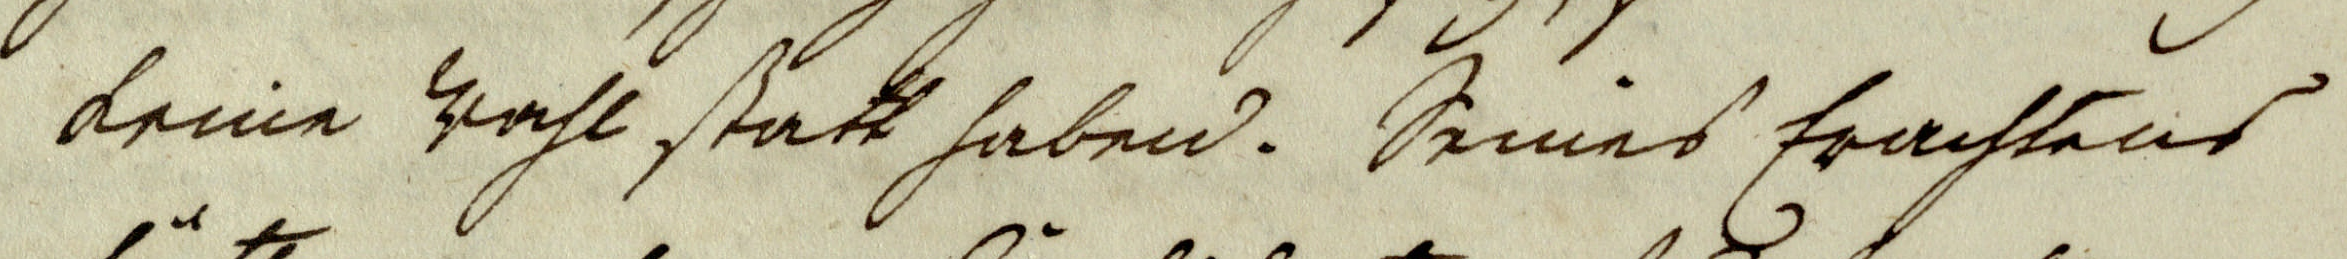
keine Wahl statt haben. Seines Erachtens
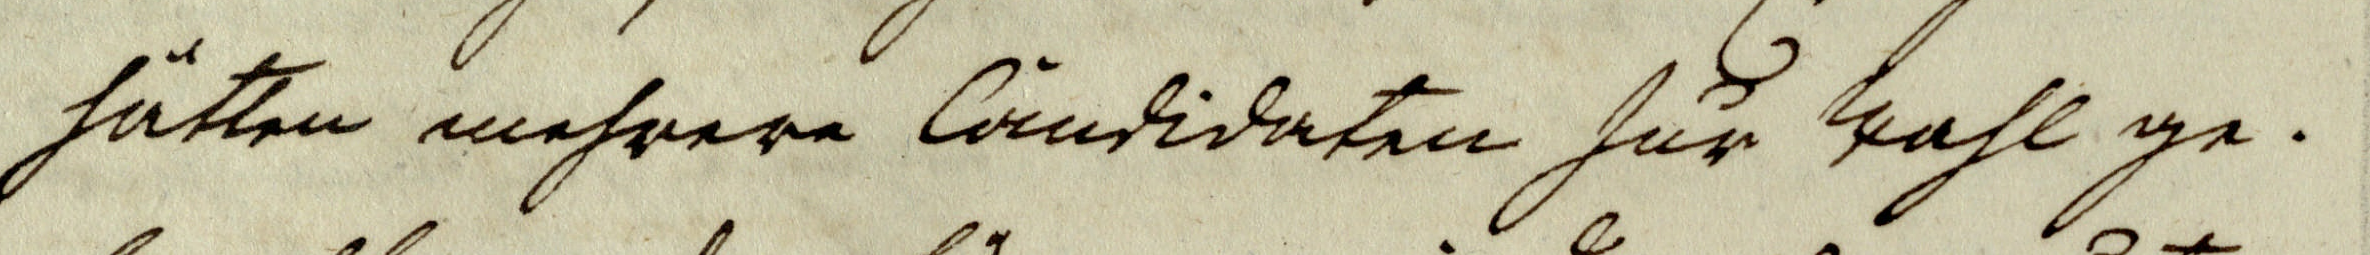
hätten mehrere Candidaten zur Wahl ge¬
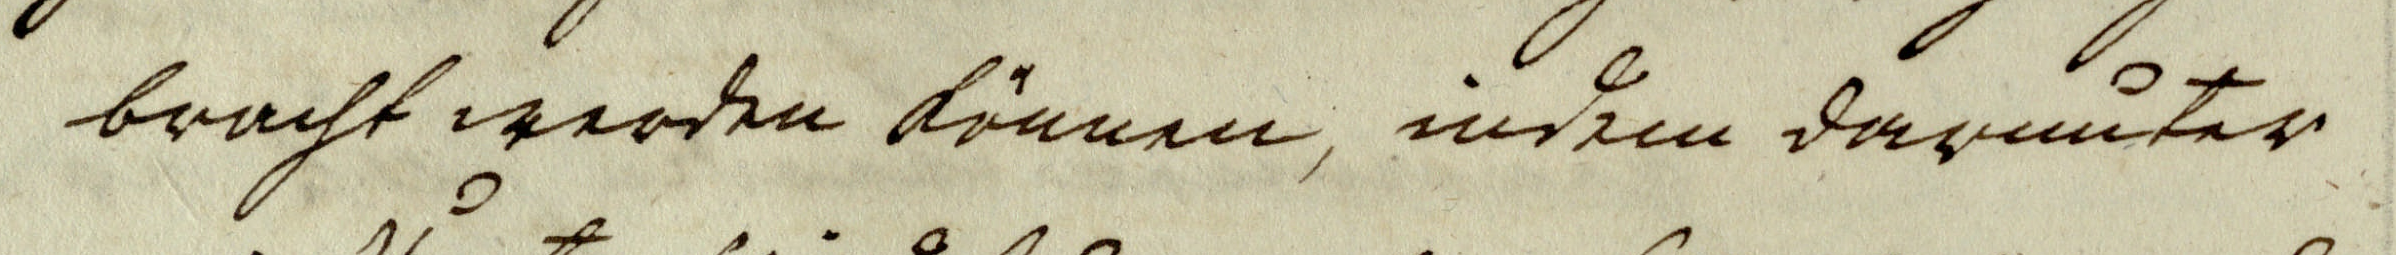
bracht werden können, indem darunter
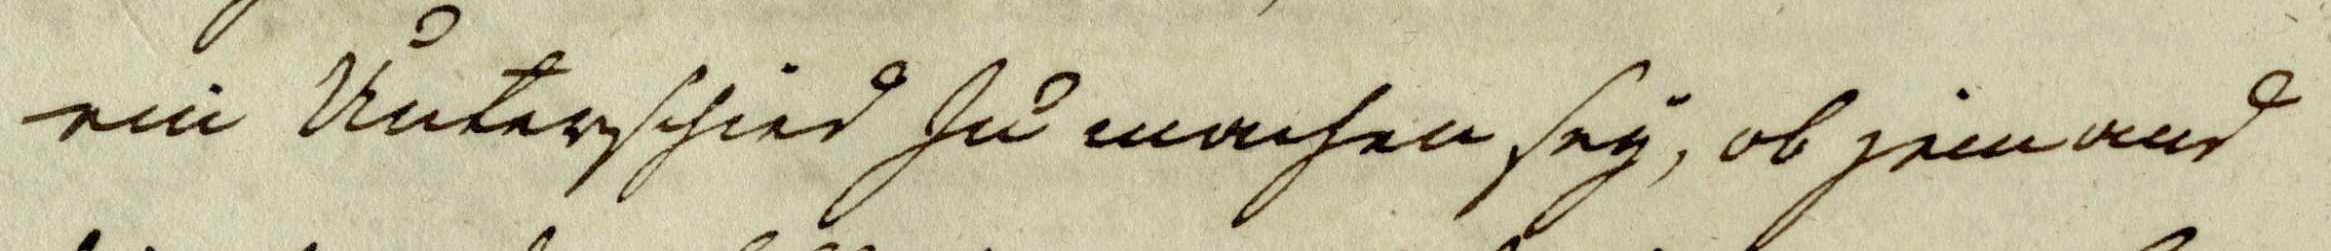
ein Unterschied zu machen seÿ, ob jemand
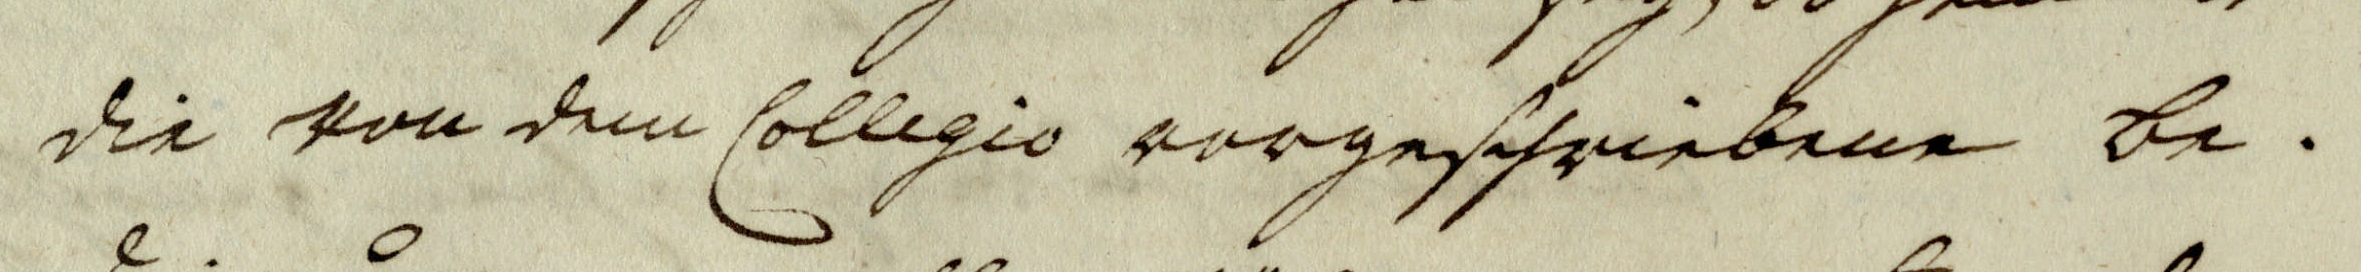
die von dem Collegio vorgeschriebene Be¬
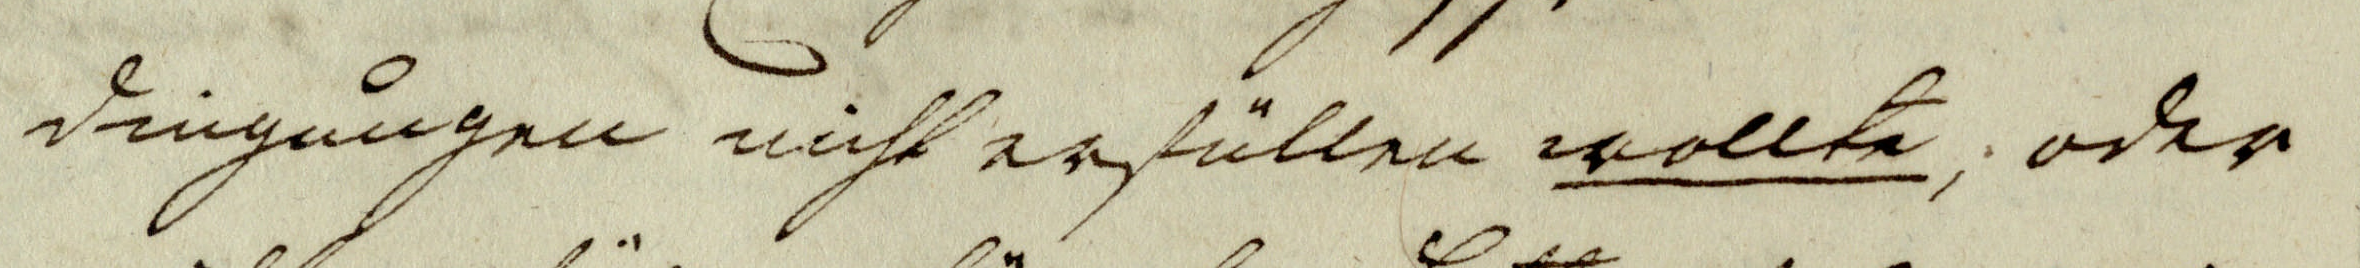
dingungen nicht erfüllen wollte, oder
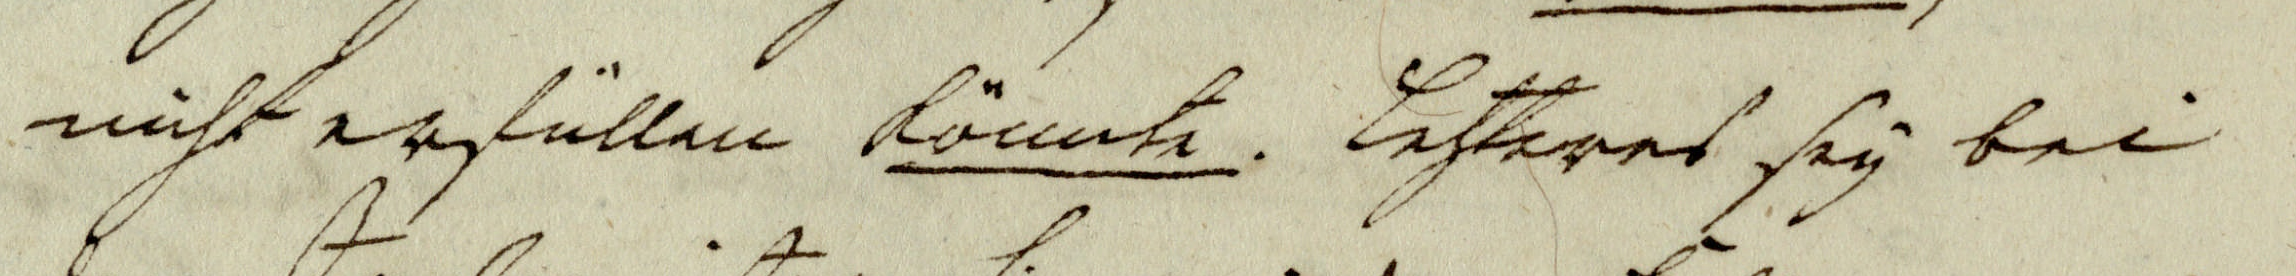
nicht erfüllen könnte. Letzteres seÿ bei
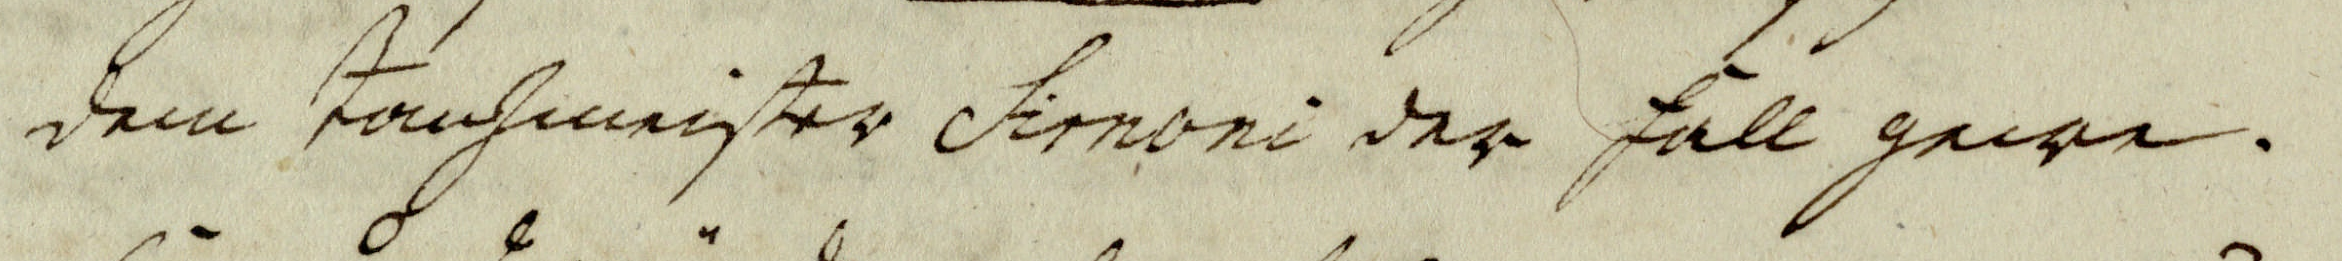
dem Tanzmeister Simoni der Fall gewe¬
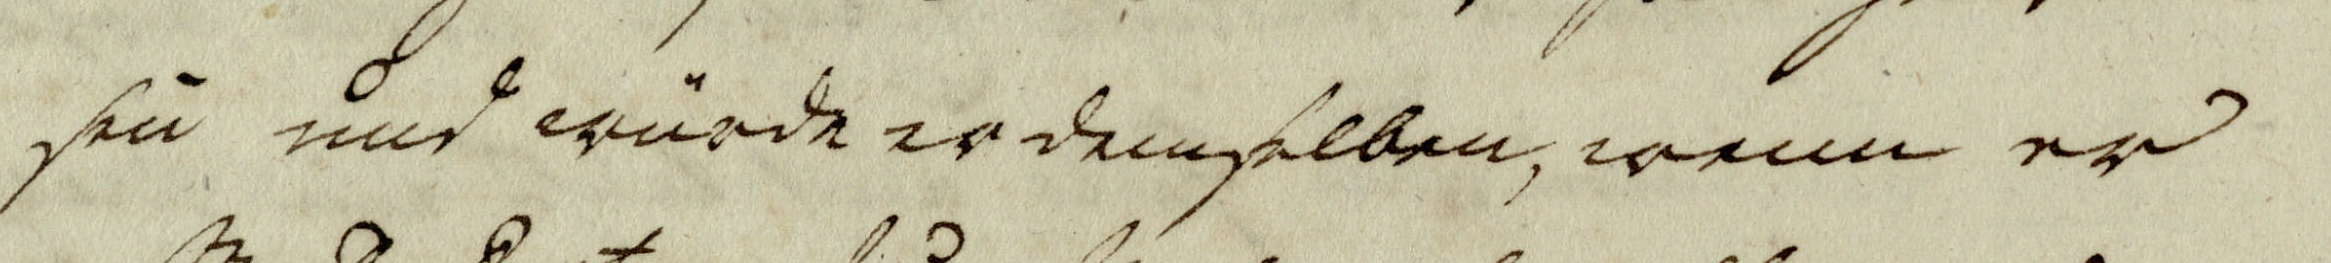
sen und würde er demselben, wenn er
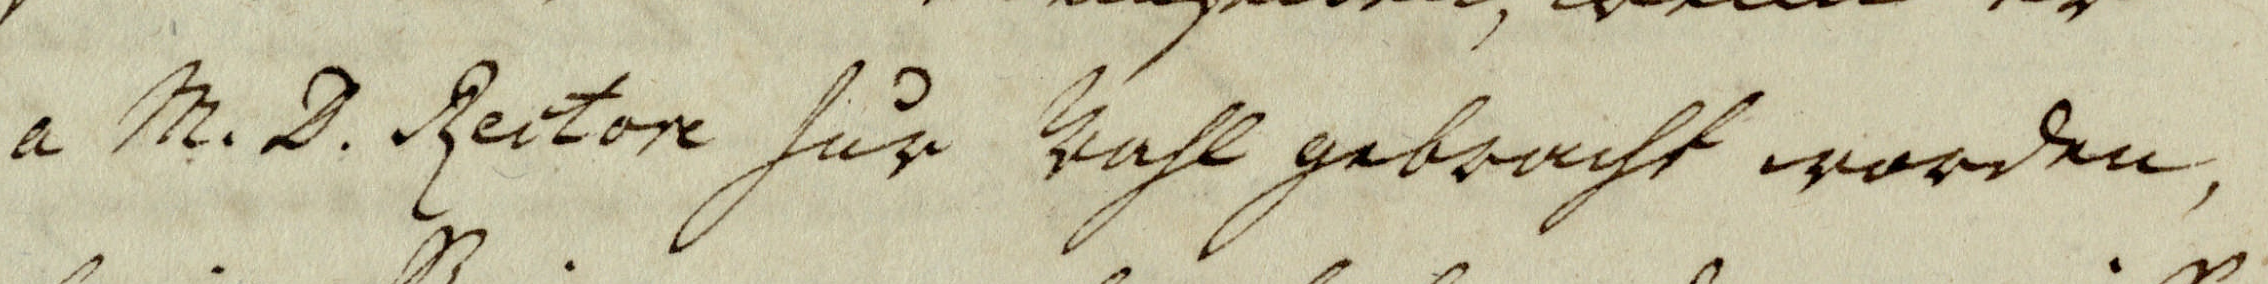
a M. D. Rector zur Wahl gebracht worden,
